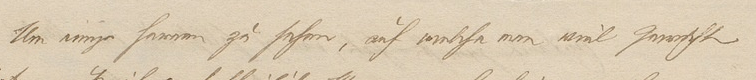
Um einige Herren zu sehen, auf welche man viel Gewicht
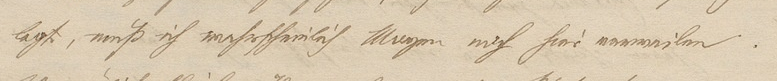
legt, muß ich wahrscheinlich Morgen noch hier verweilen.
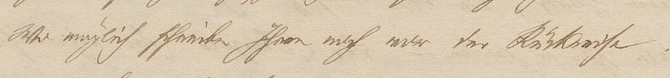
Wo möglich schreibe Ihnen noch vor der Rückreise.
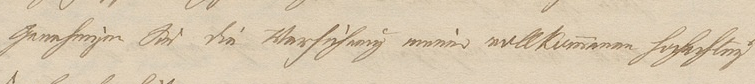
Genehmigen Sie die Versicherung meiner vollkommenen Hochachtung
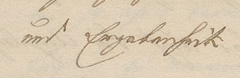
und Ergebenheit
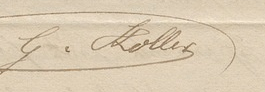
G. Koller
